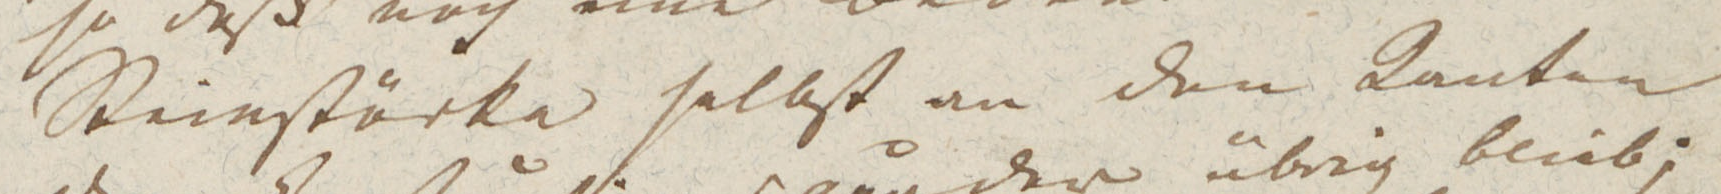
Steinstärke selbst an den Kanten
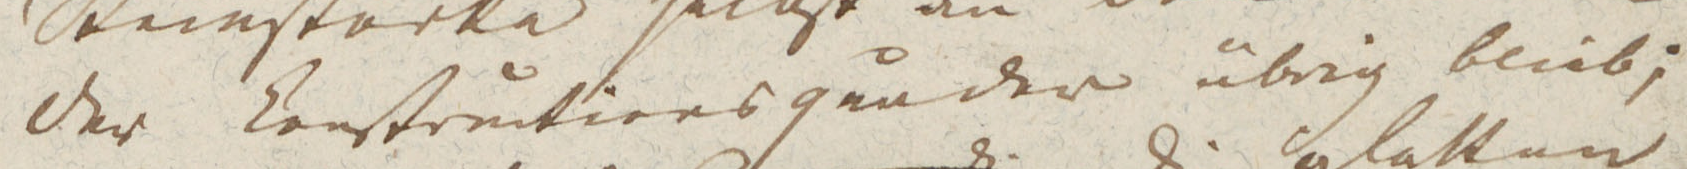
der Constructionsquader übrig blieb;
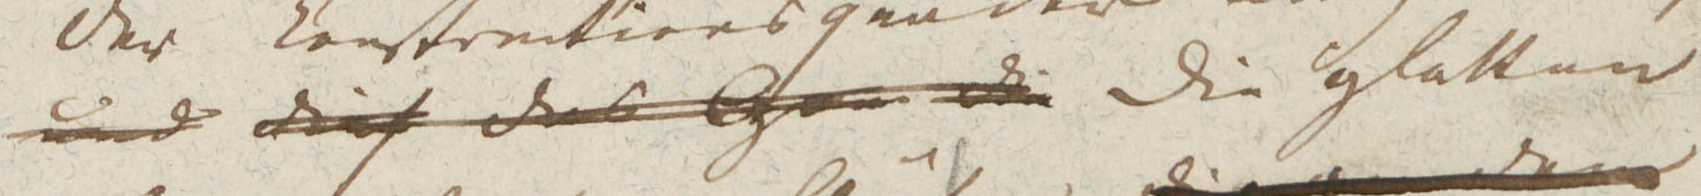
und dies das Gan die Die glatten
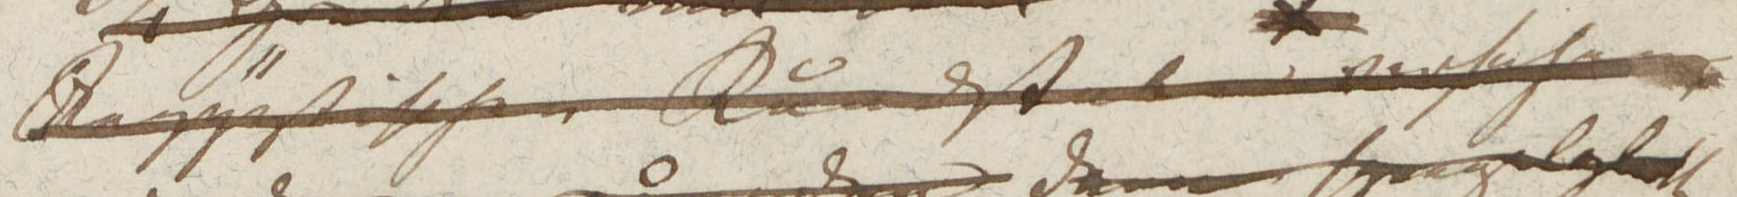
Aegyptischen Rundstabe % versehen
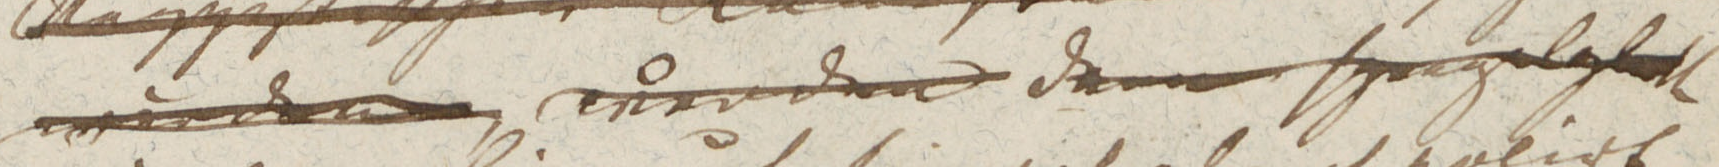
würden wurden denn spiegelglatt
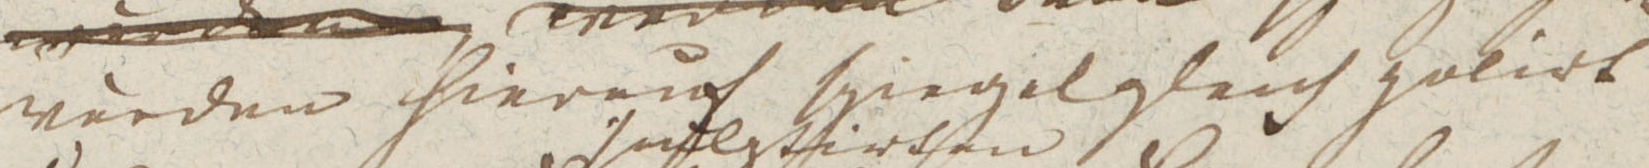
wurden hierauf spiegelgleich polirt
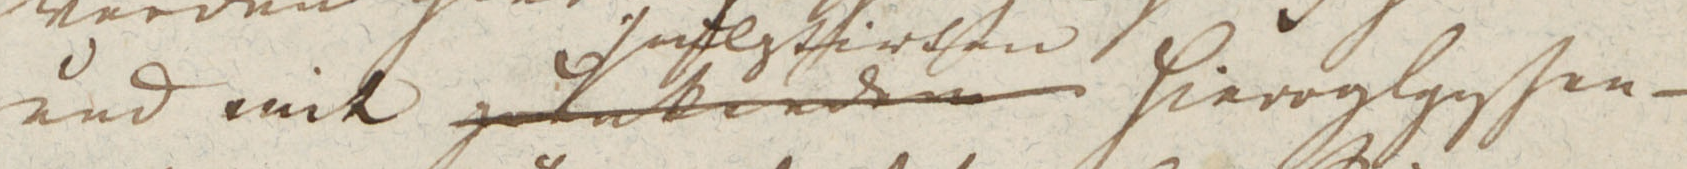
und mit kenden sculptirten Hieroglyphen-
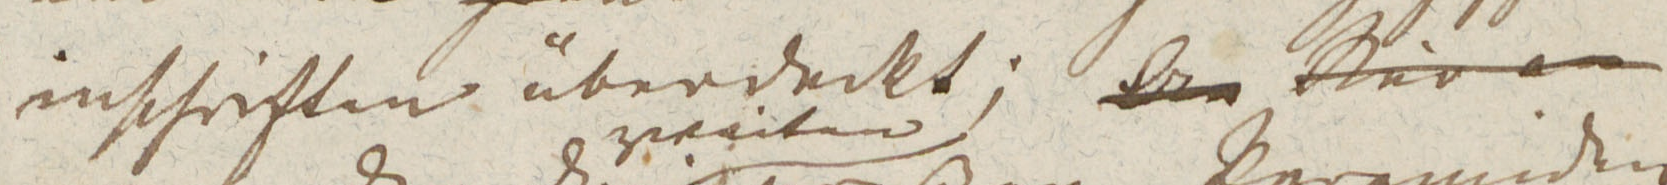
inschriften überdeckt; An Nur an
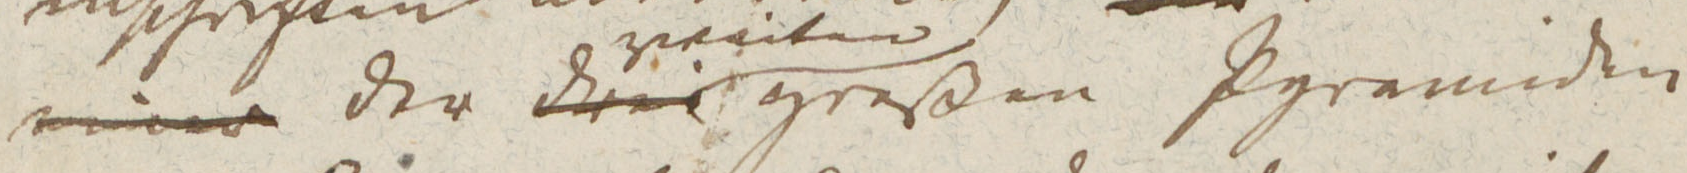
einer der drei zweiten grossen Pyramiden
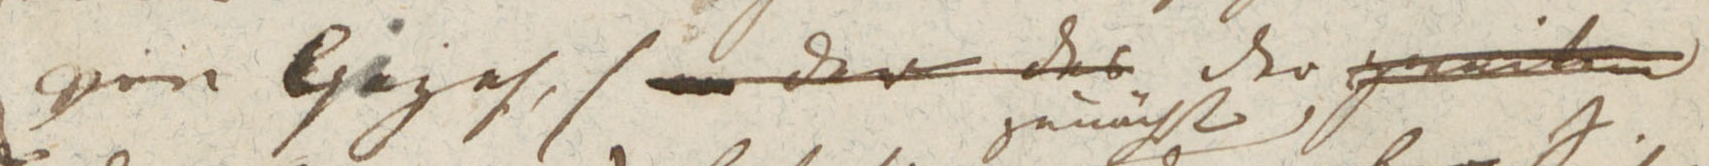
von Gizeh, (in der das der zweiten
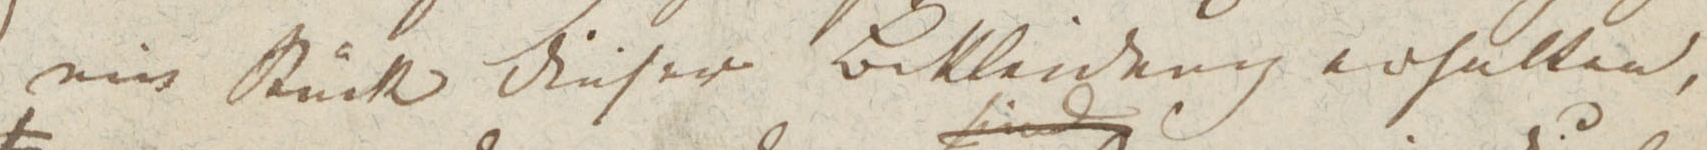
ein Stück dieser Bekleidung erhalten,
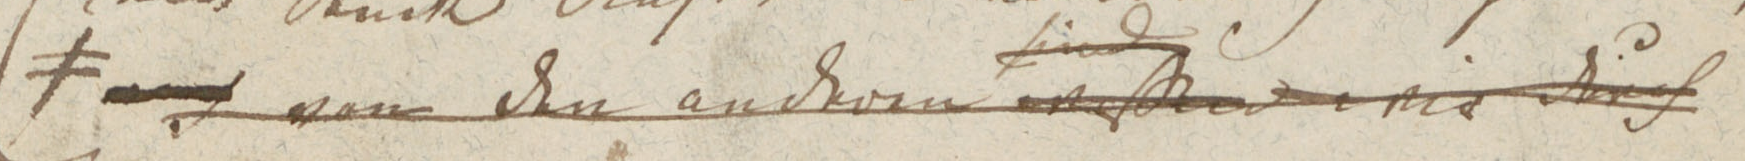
% noch von den anderen wissen sind wie durch
